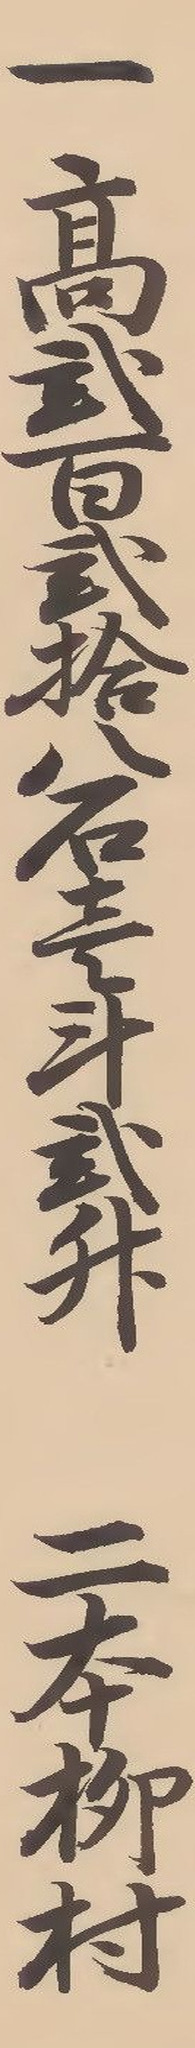一高弐百弐拾八石壱斗弐升二本柳村
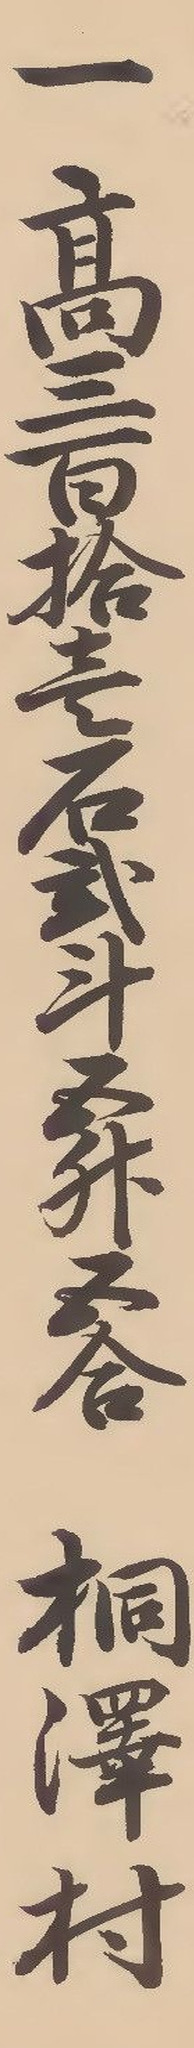一高三百拾壱石弐斗五升五合桐沢村
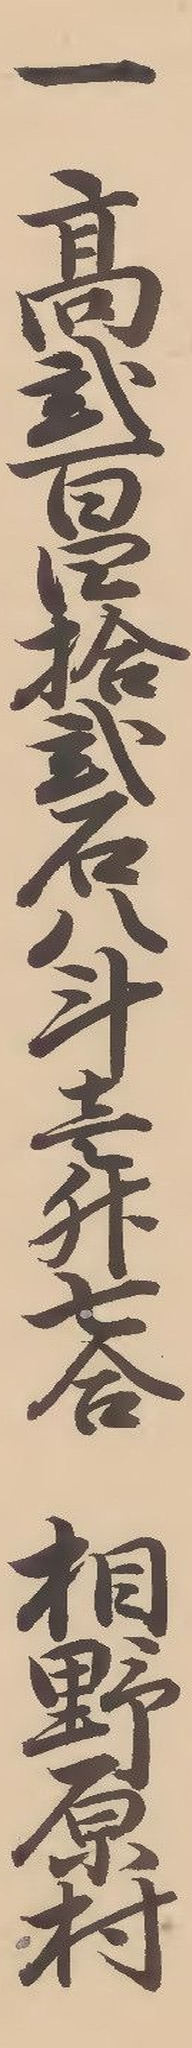一高弐百四拾弐石八斗壱升七合相野原村

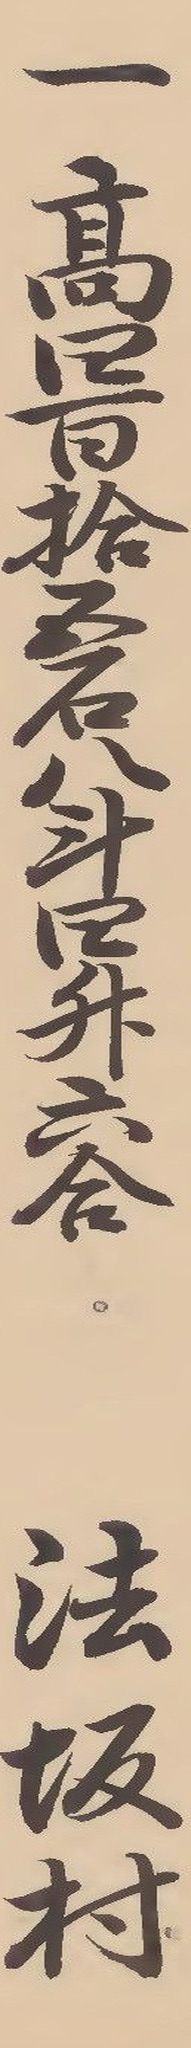一高四百拾五石八斗四升六合法坂村
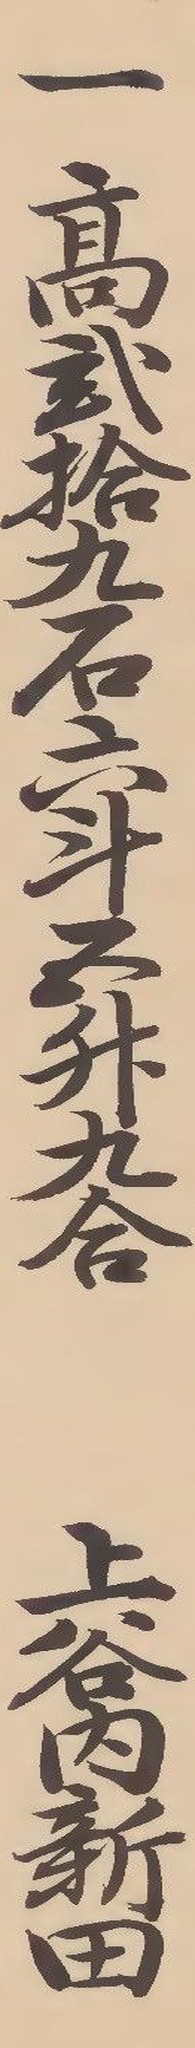一高弐拾九石六斗五升九合上谷内新田
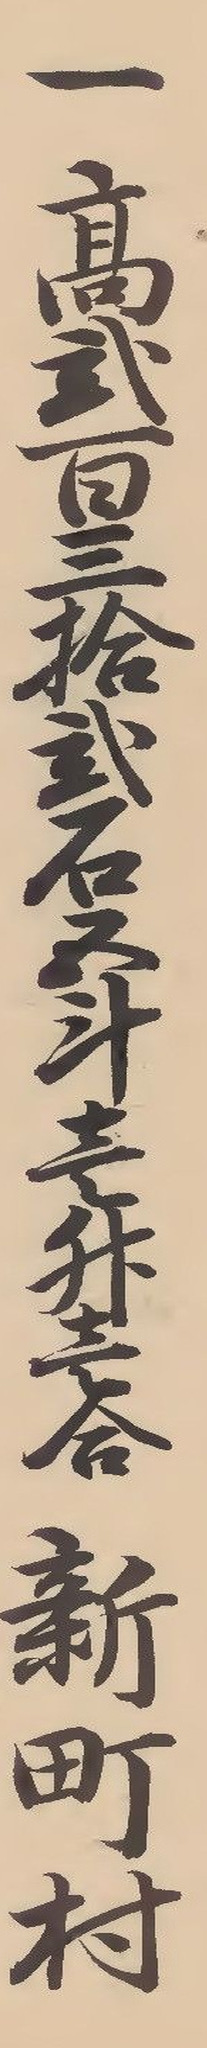一高弐百三拾弐石五斗壱升壱合新町村
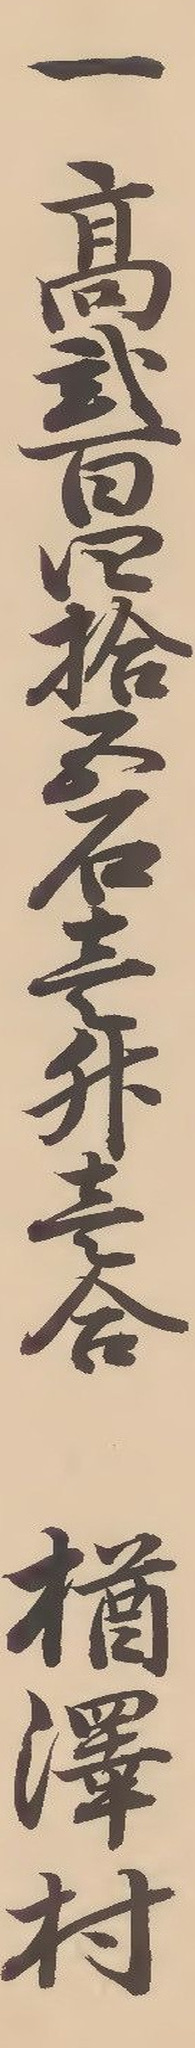一高弐百四拾五石壱升壱合楢沢村
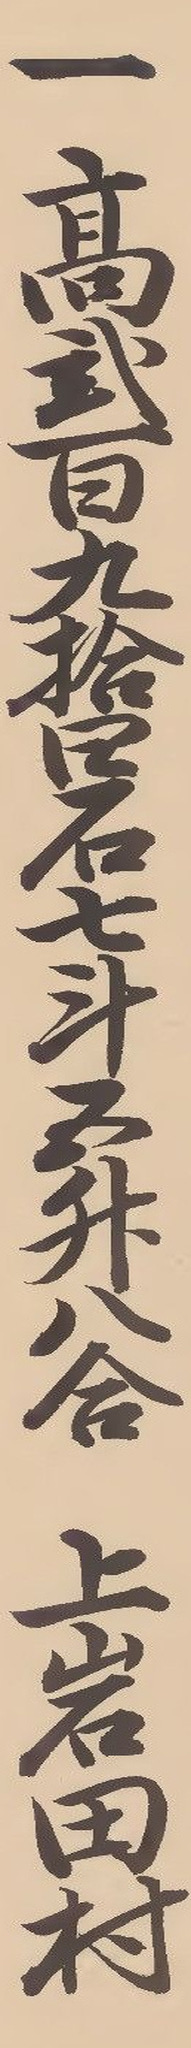一高弐百九拾四石七斗五升八合上岩田村
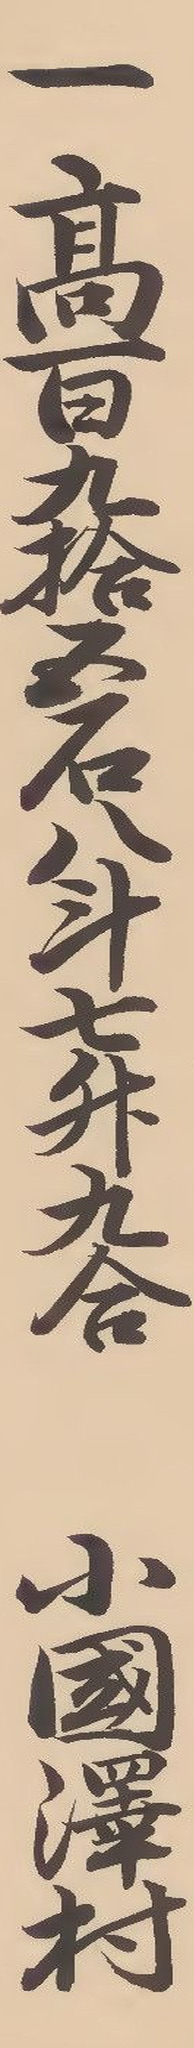一高百九拾五石八斗七升九合小国沢村
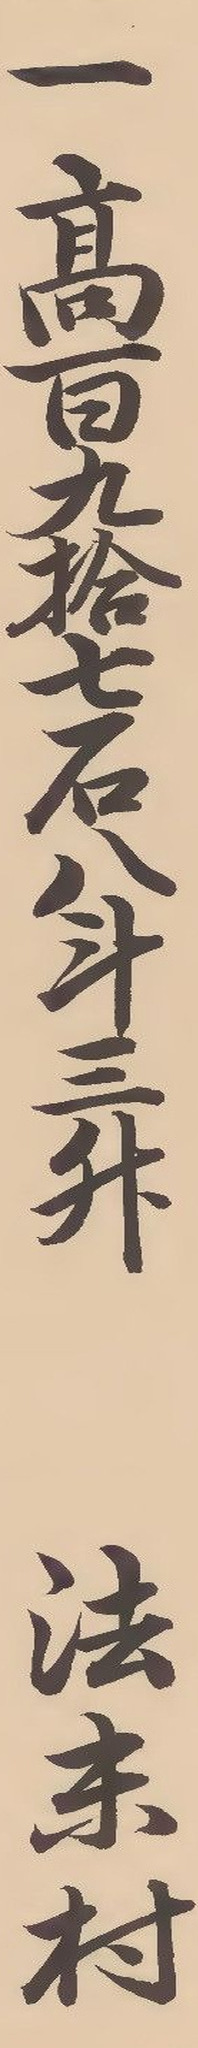一高百九拾七石八斗三升法末村
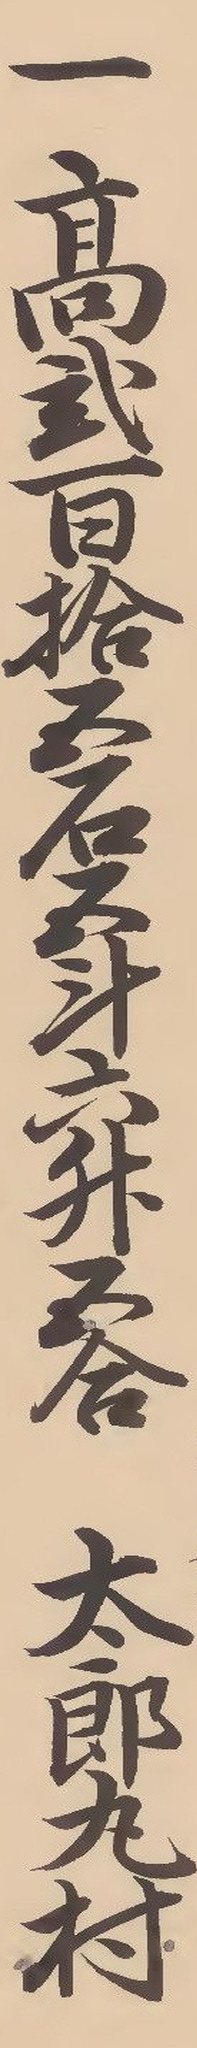一高弐百拾五石五斗六升五合太郎丸村

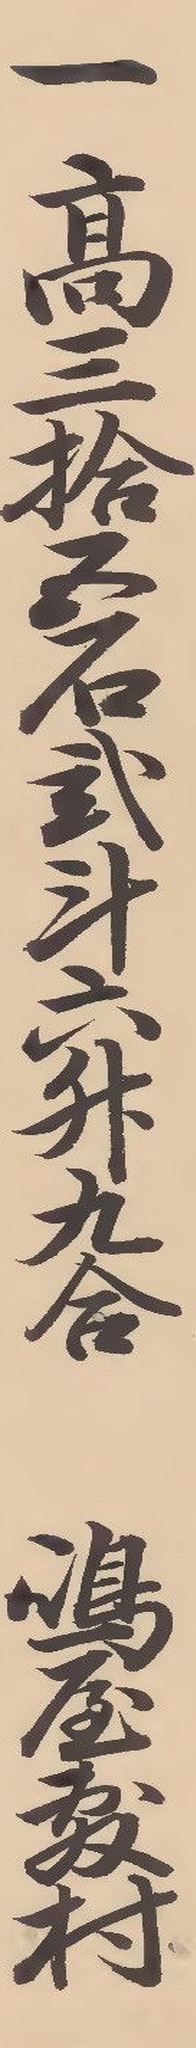一高三拾五石弐斗六升九合島屋敷村
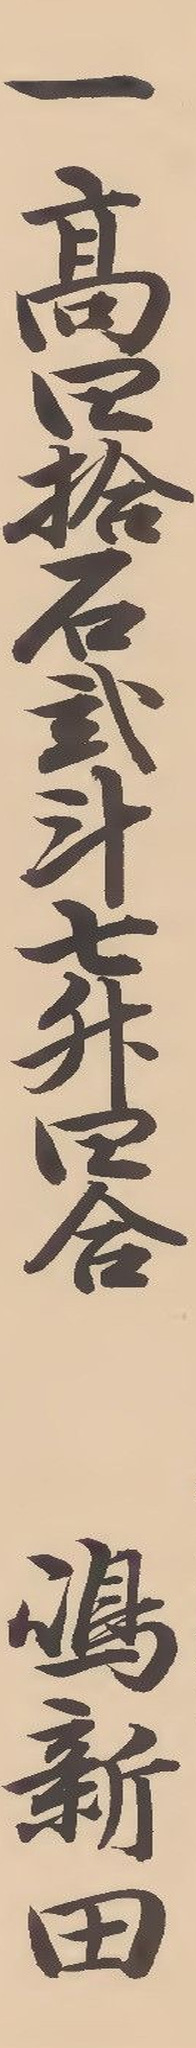一高四拾石弐斗七升四合島新田
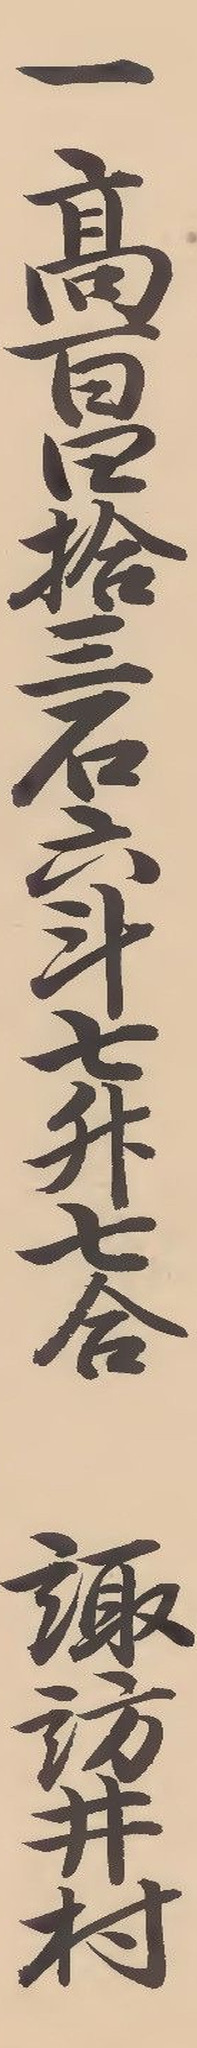一高百四拾三石六斗七升七合諏訪井村
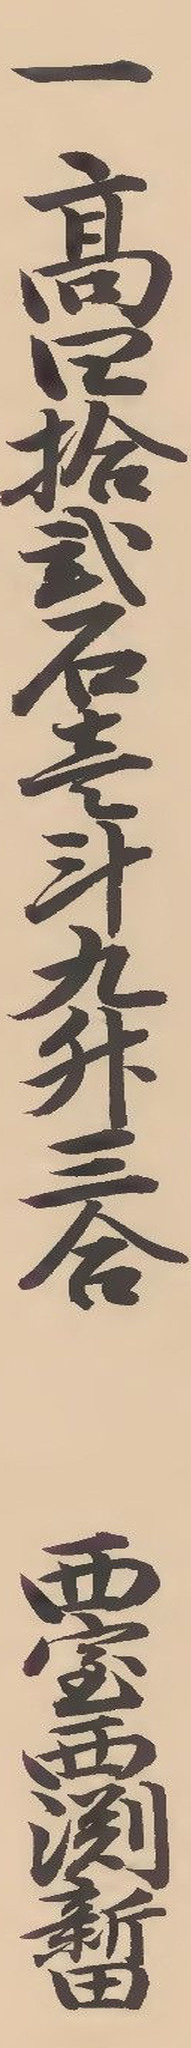一高四拾弐石壱斗九升三合西室西渕新田
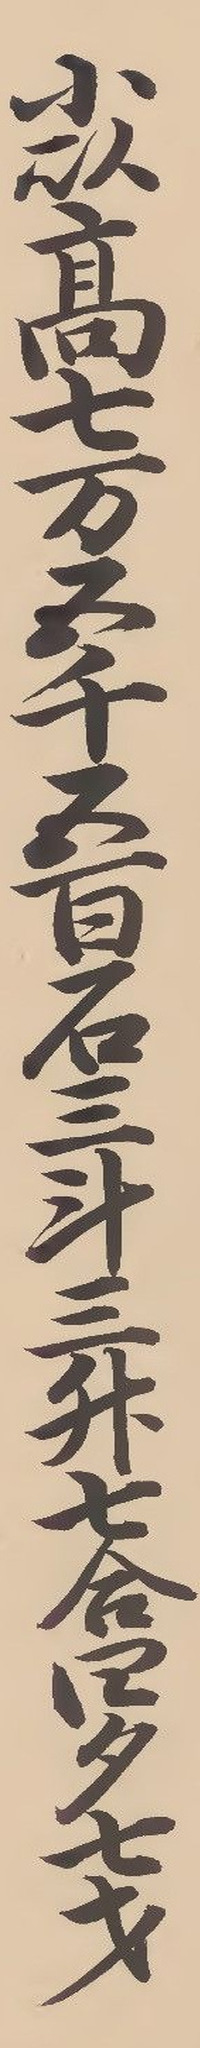小以高七万五千五百石三斗三升七合四勺七才
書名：越後国郷帳　中
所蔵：国立公文書館 National Archives of Japan
